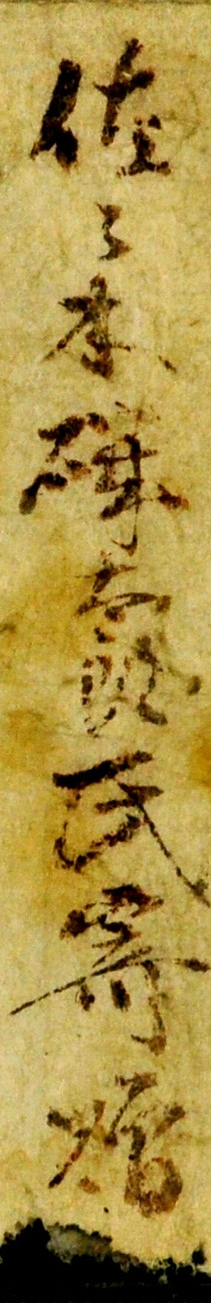佐々木磯太郎氏寄贈
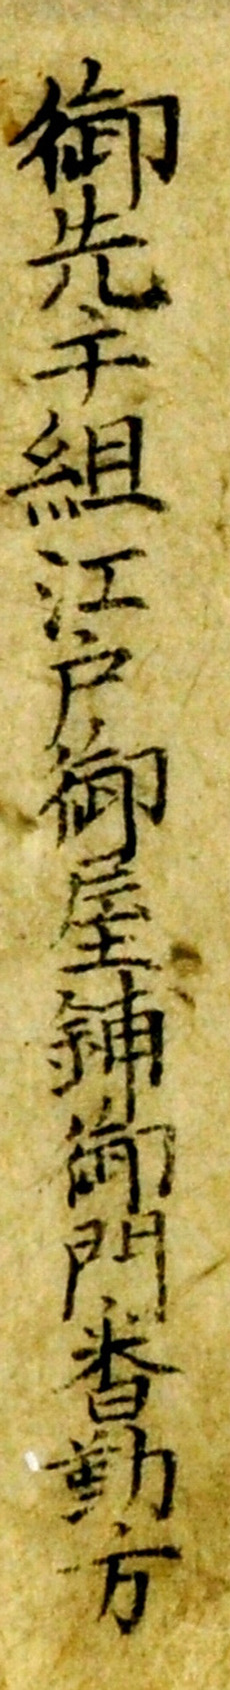御先手組江戸屋鋪御門番勤方

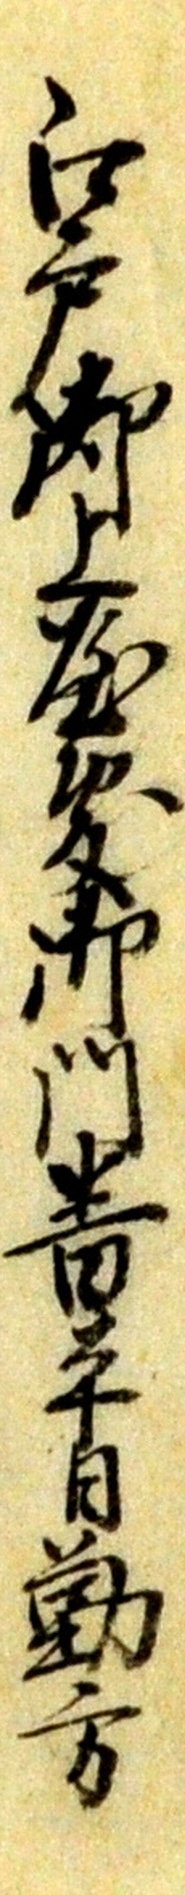江戸御上屋敷御門番平日勤方
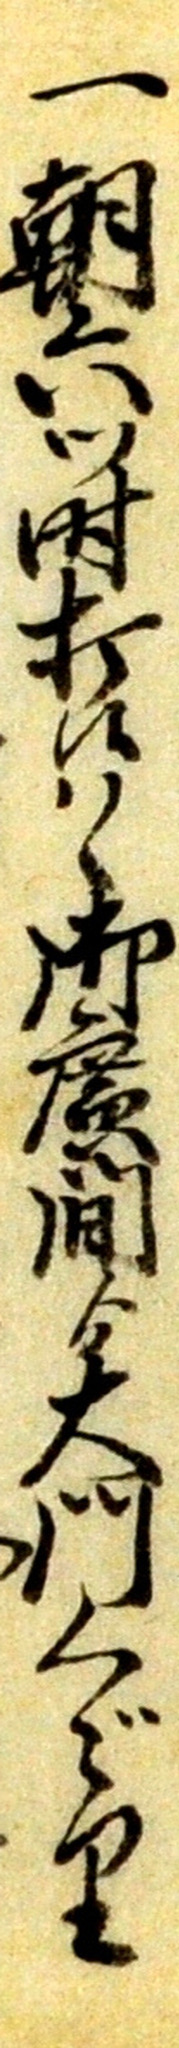一朝六ツ時打候ハヽ御広間ゟ大門くゞり
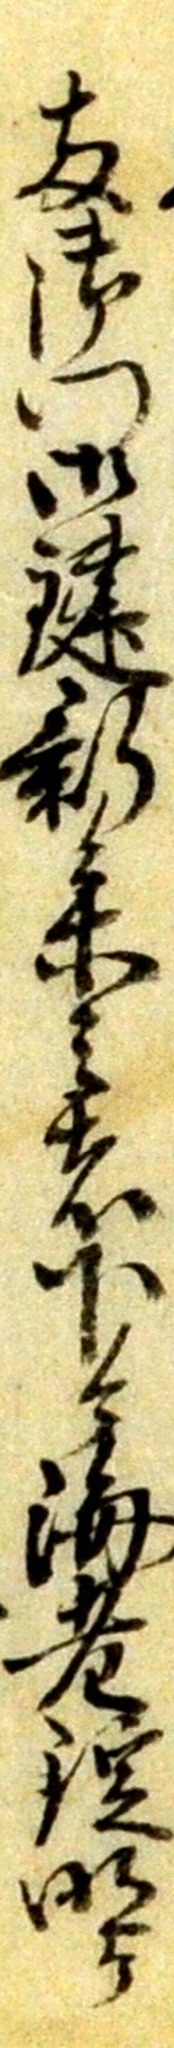両御門御鍵新参之者下ケ海老錠明ケ
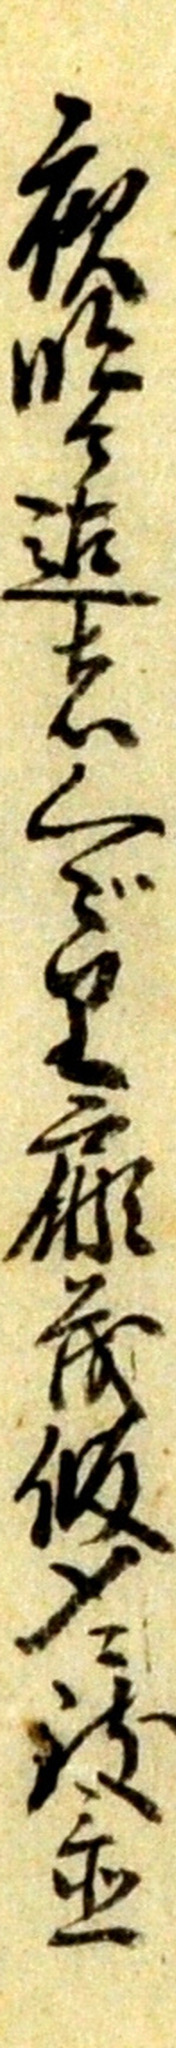夜明ケ迄者くゞり扉も仮〆ニ致置
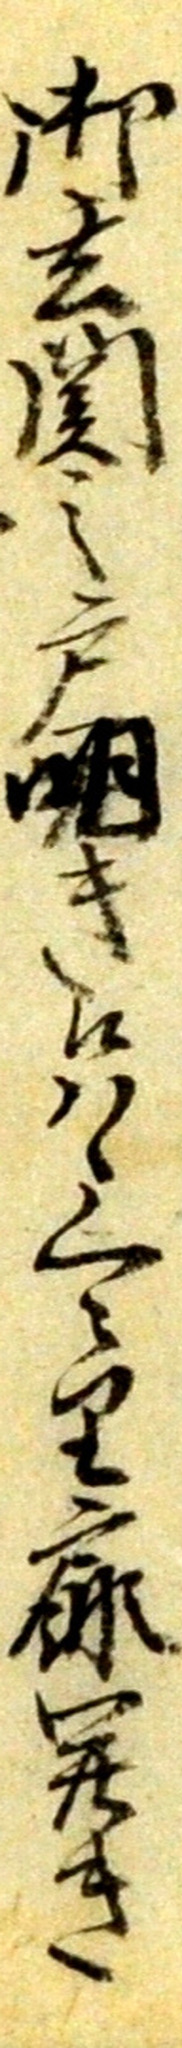御玄関之戸明き候ハヽくゝり扉開き
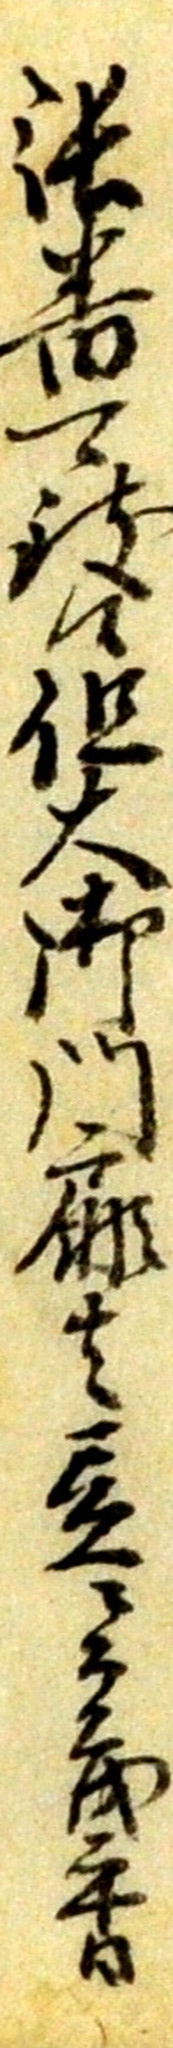張番可致候但大御門扉者昼ニテも平日
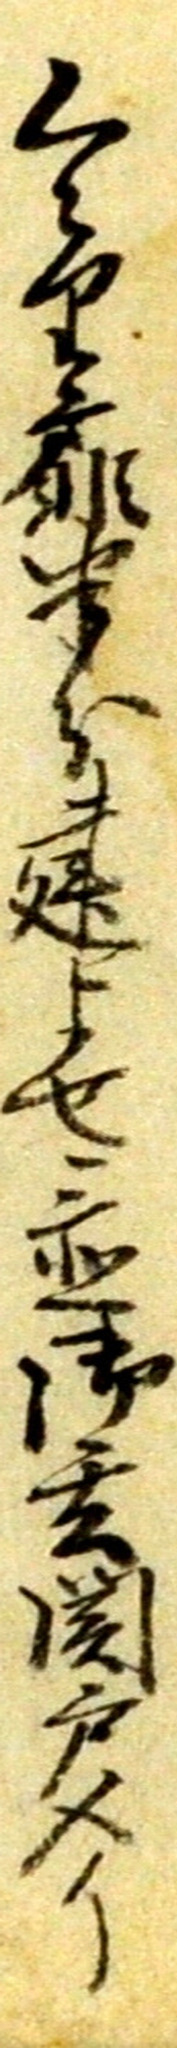くゝり扉半分建よせ置御玄関戸〆り
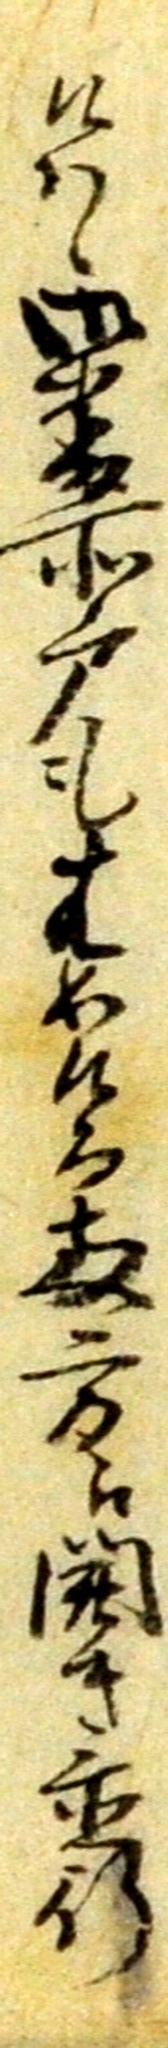候ハヽ御番所戸もはめ候而両方え開き置行
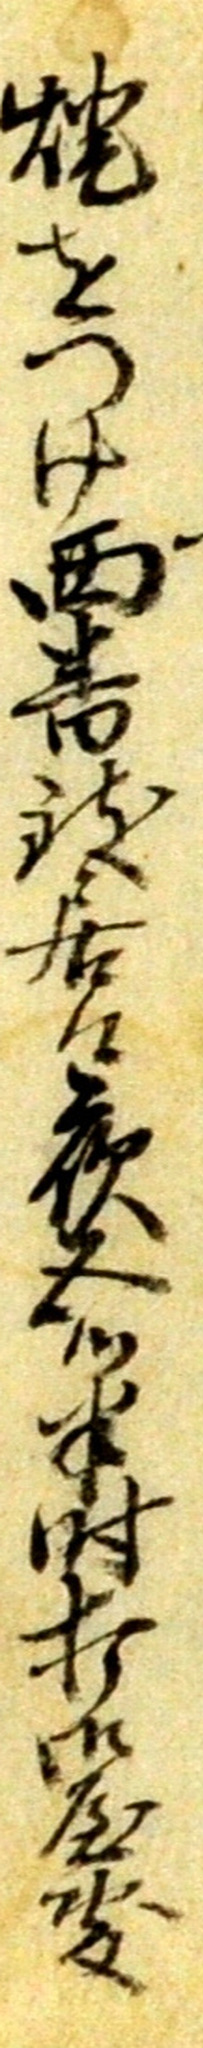燈をつけ西番致居候夜五ツ半時打御屋敷
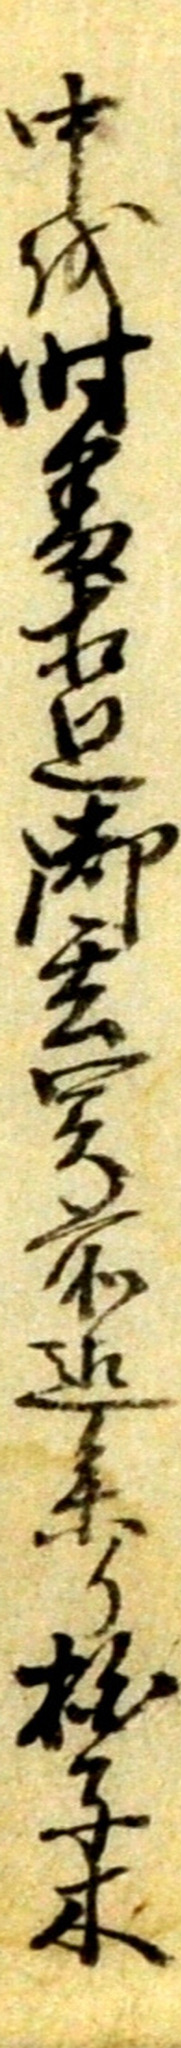中を時番相廻御玄関前迄参り拍子木
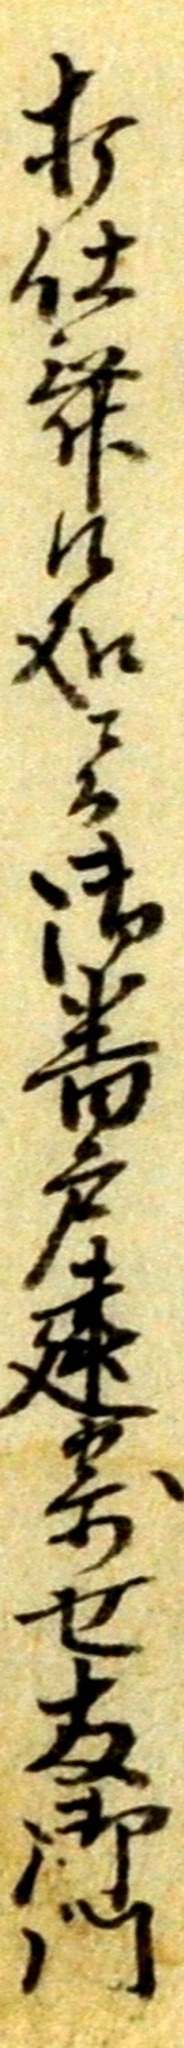打仕舞候処ニ而御番戸建寄せ両御門
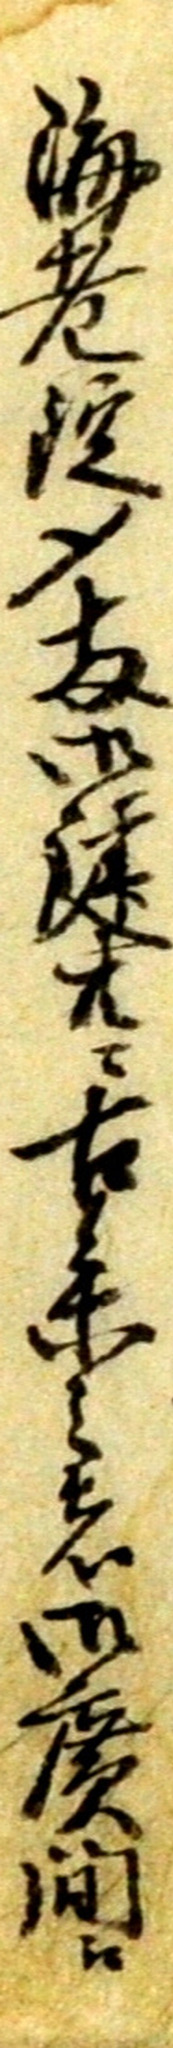海老錠〆両御鍵共々古参之者御広間え
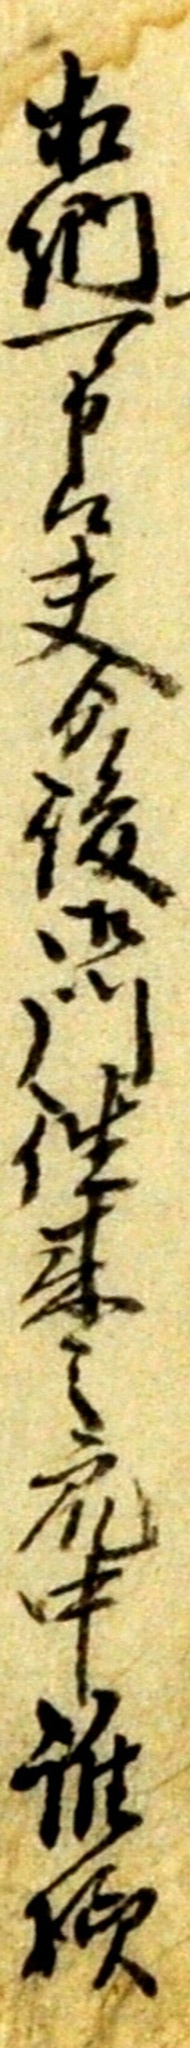相納可申候夫ゟ後御門往来之衆中誰様
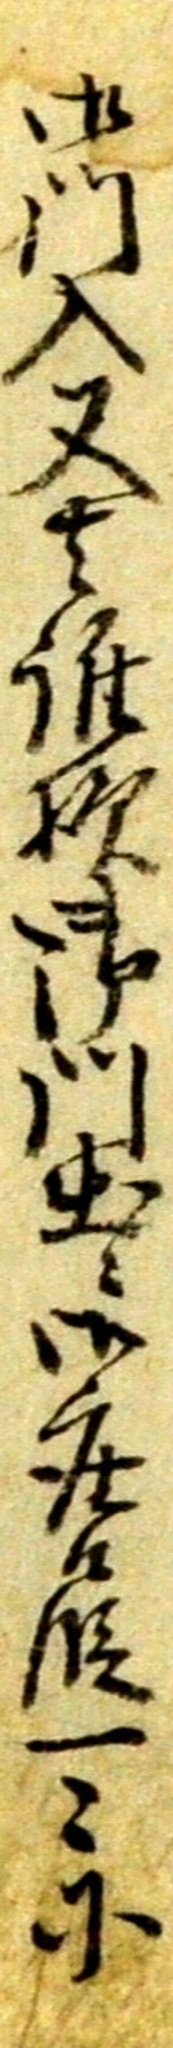御門入又者誰様御門出ニ御座候段一々に
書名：御先手組江戸御屋敷御門番勤方
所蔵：伊那市立高遠町図書館・合同会社AMANE
